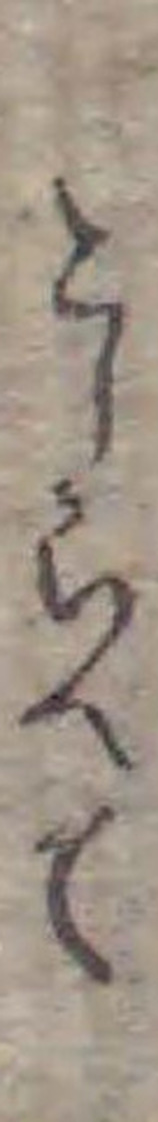こしらへて
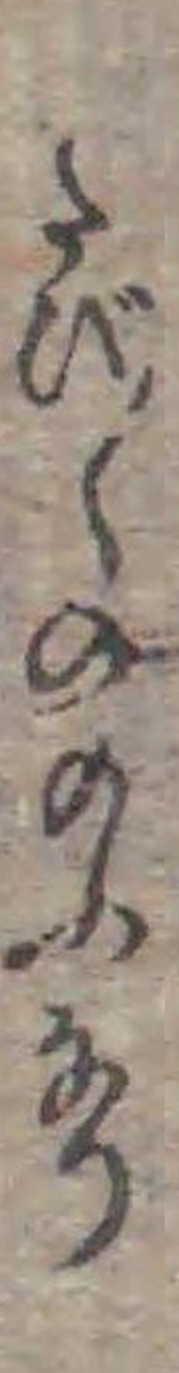たび〳〵ののふなり
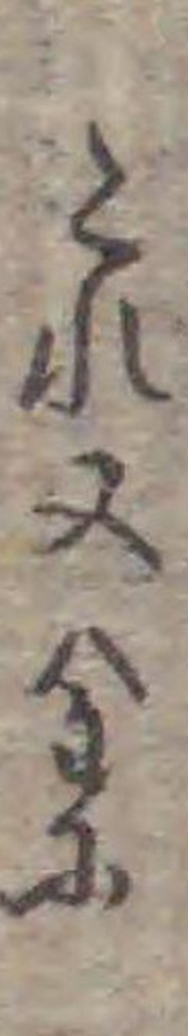これ又金に
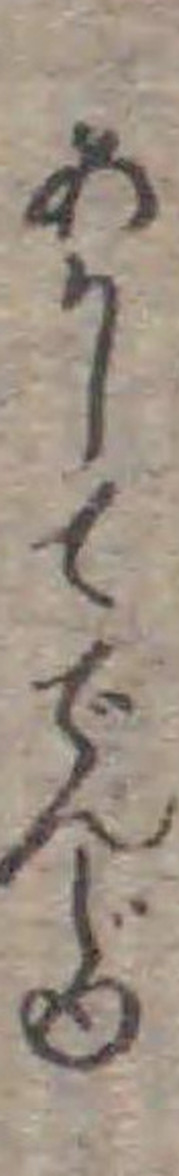あかしてでんじゆ
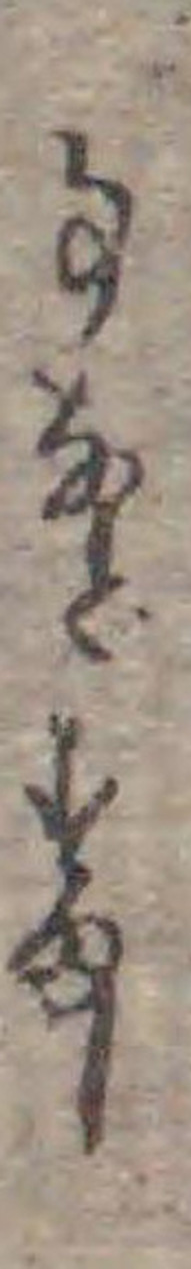事などすまし
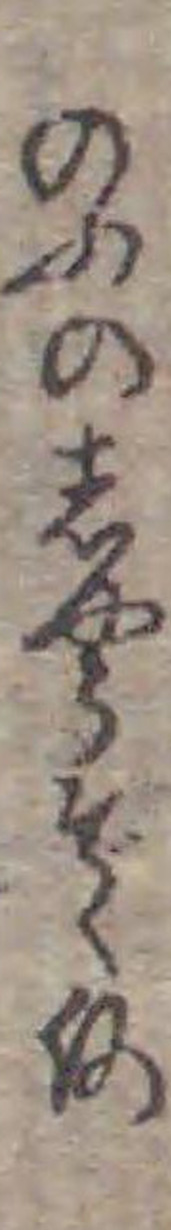のふのしやうぞく何
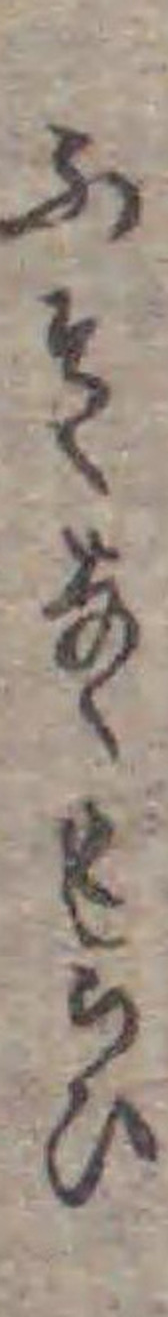ふそくなくこしらひ
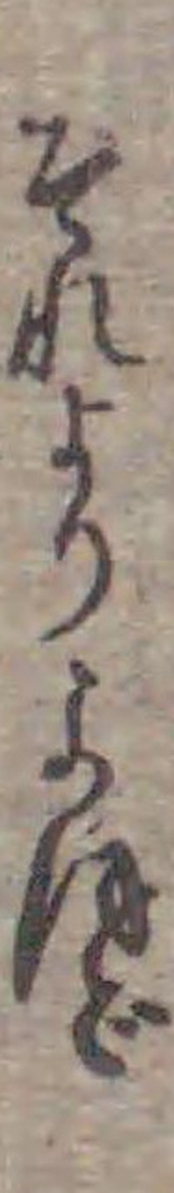それよりよほど
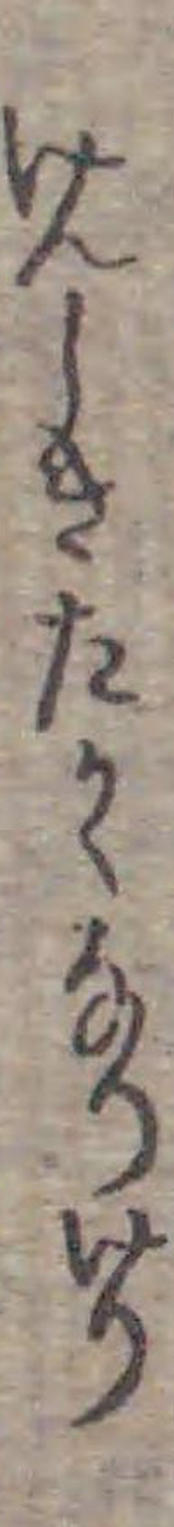けんしきたかくなりけり
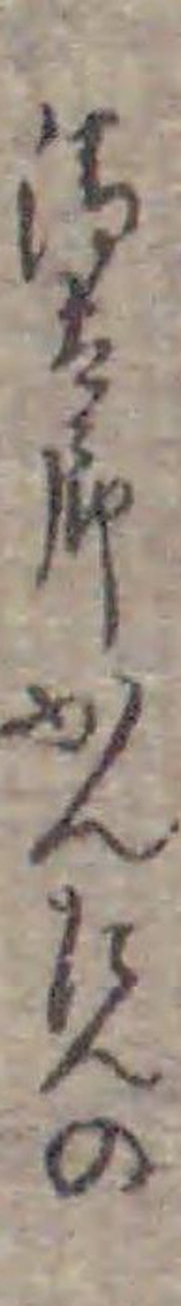清太郎かんたんの
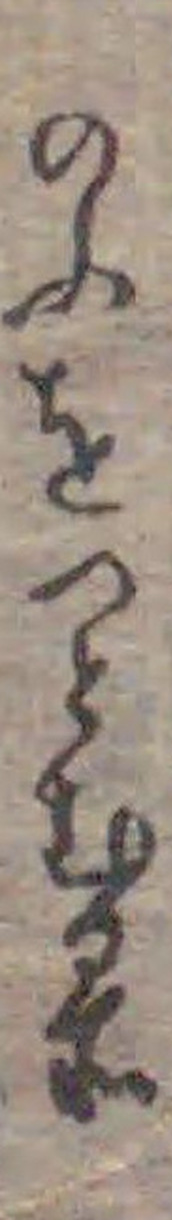のふをつとむる所

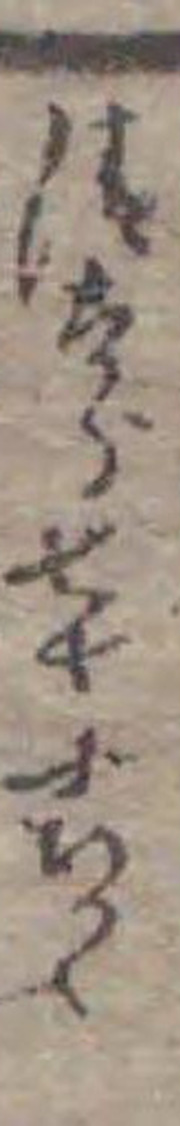清太郎七十にちかく
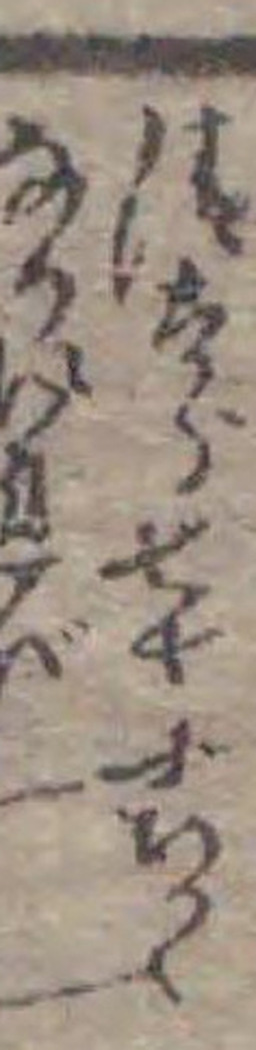なりければ
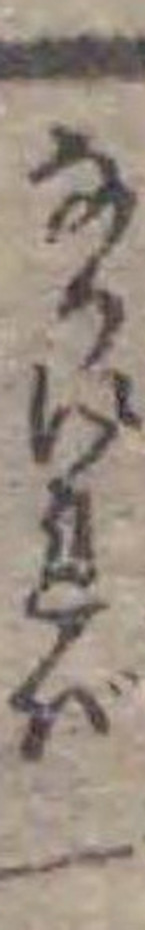なりければ
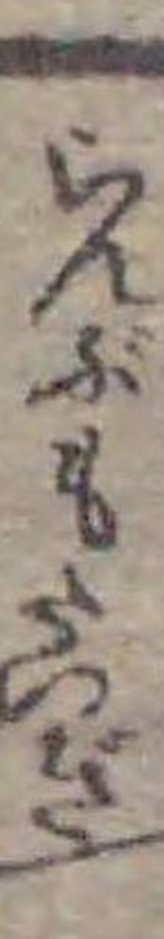らんぶもたいぎ
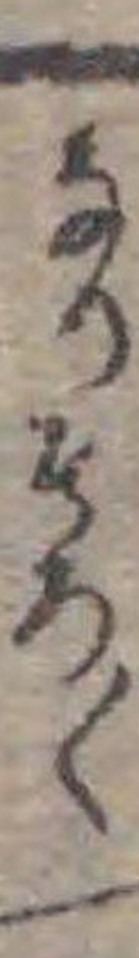なりそろ〳〵
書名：見徳一炊夢 : 3巻
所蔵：国立国会図書館 National Diet Library, JAPAN
